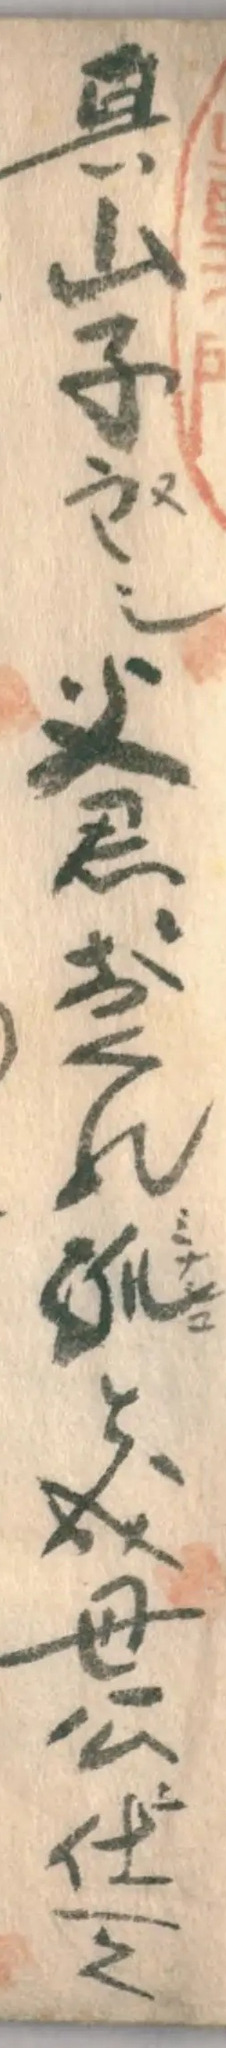真山子主父君におくれ孤と成母公に仕へ天
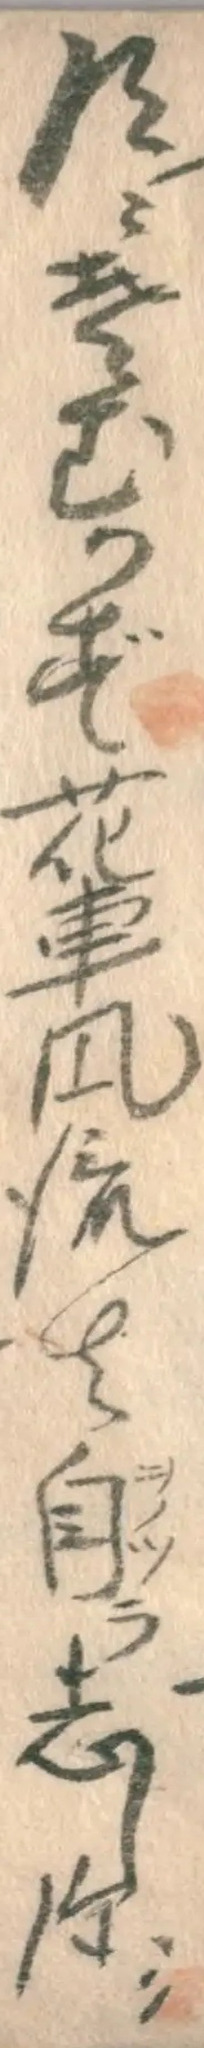道にそむかず花車風流は自志深ク
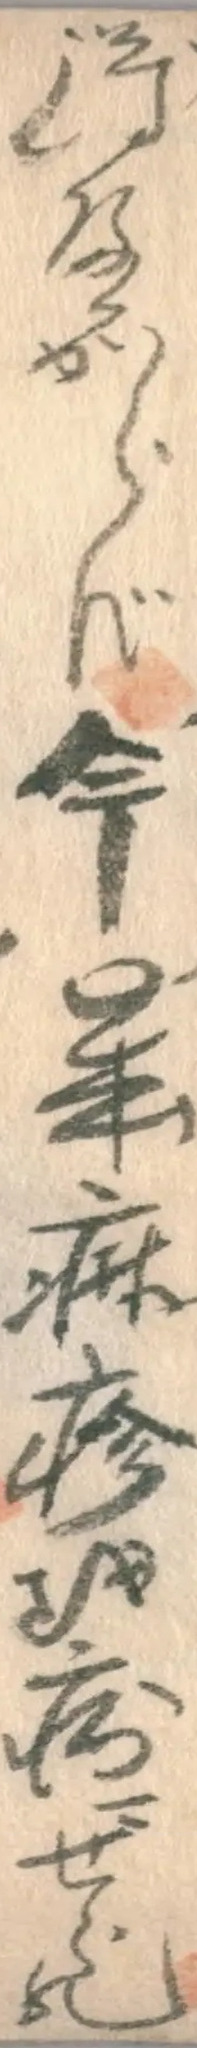得べからず今歳麻疹を病マせられ
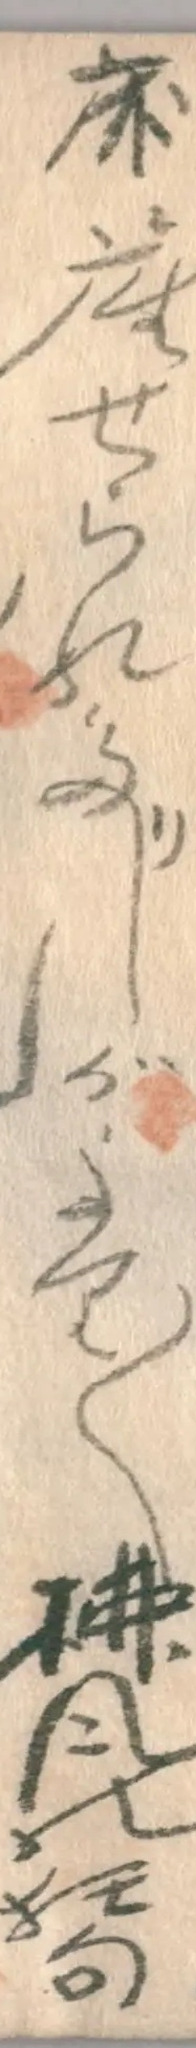床に座せられたりしがよりより柳風の狂句
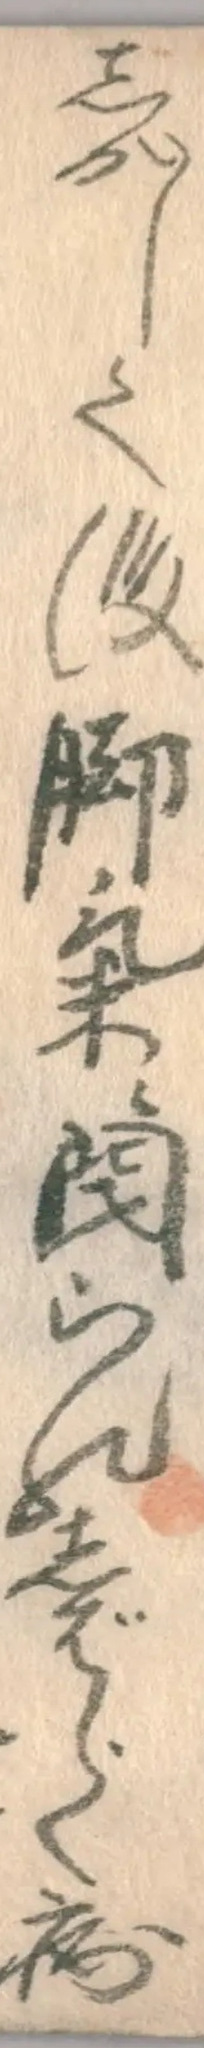しかして後脚気に関られしばらく病
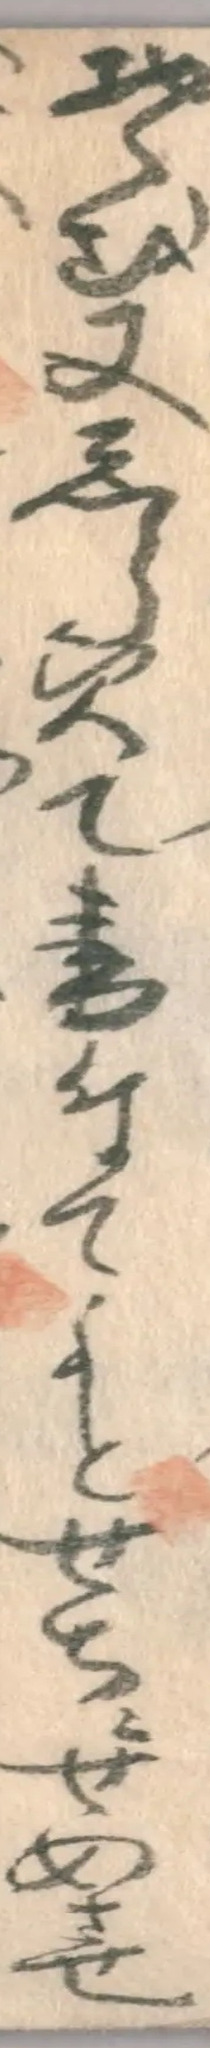そを又えらみて書付てよとせちにせめさせ
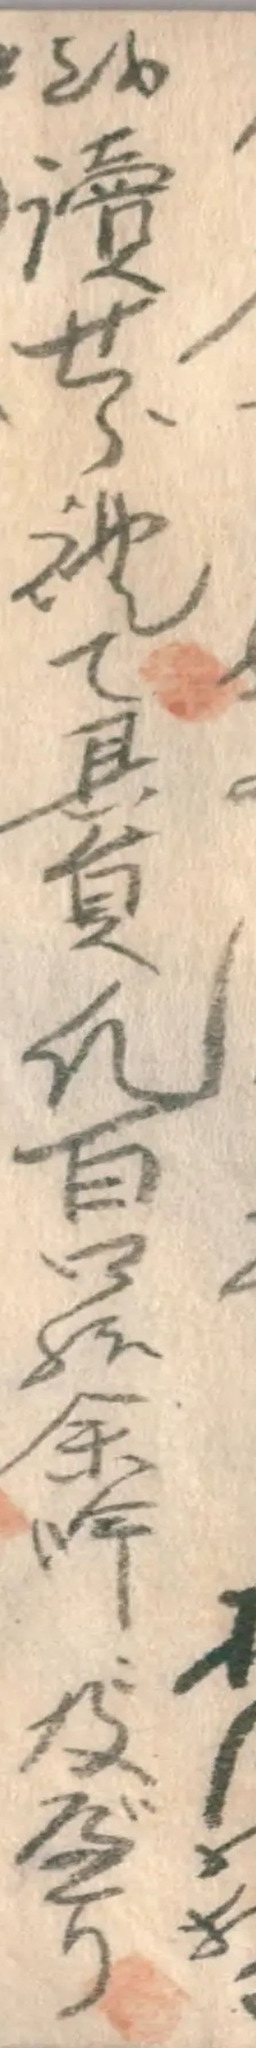を読せられて其員凡百四十余吟に及べり
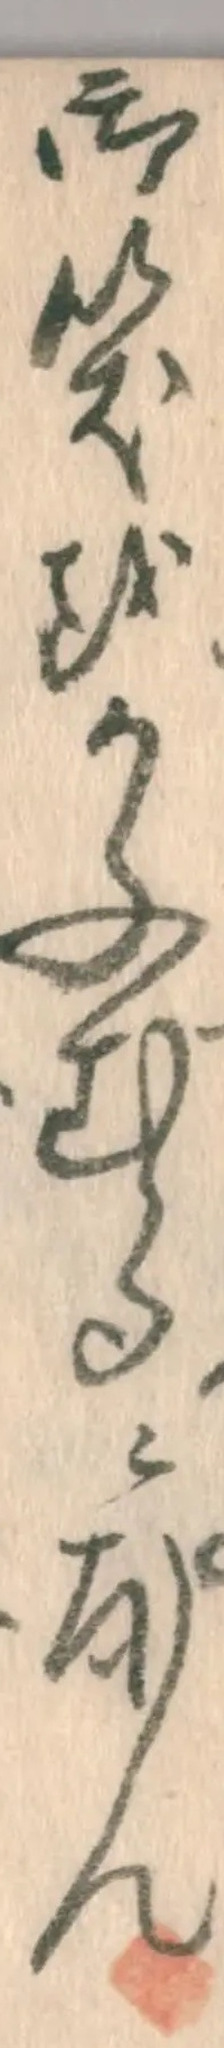御笑をかふむるになん
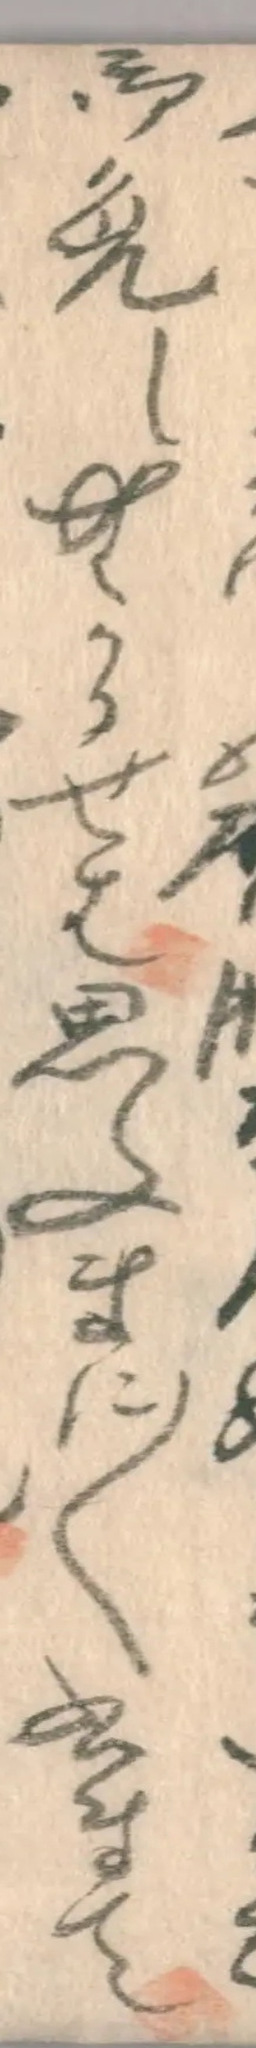御免し無からせは思ふまにまに書奉て
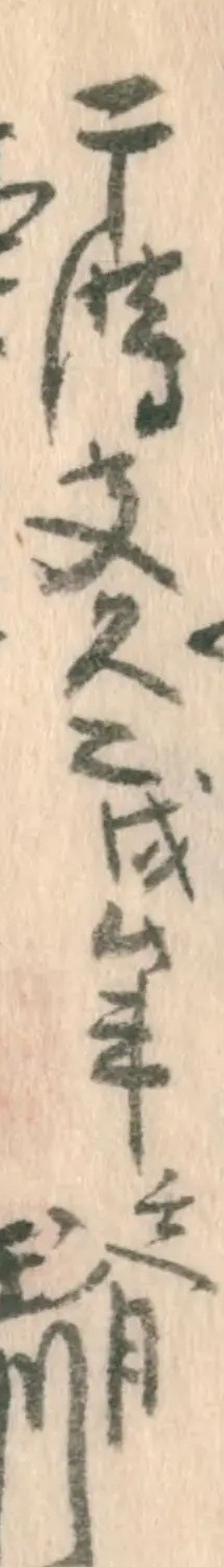于時文久二戌年閏八月
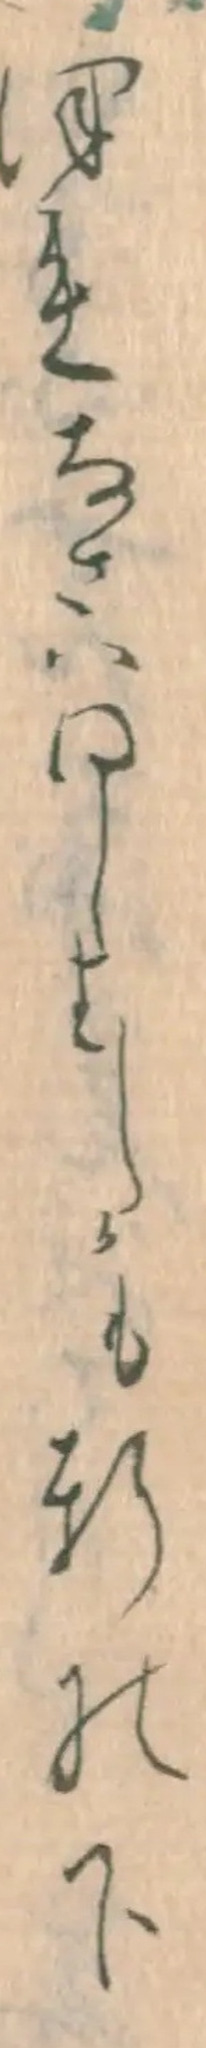ほれなさは同しはしかも路の下
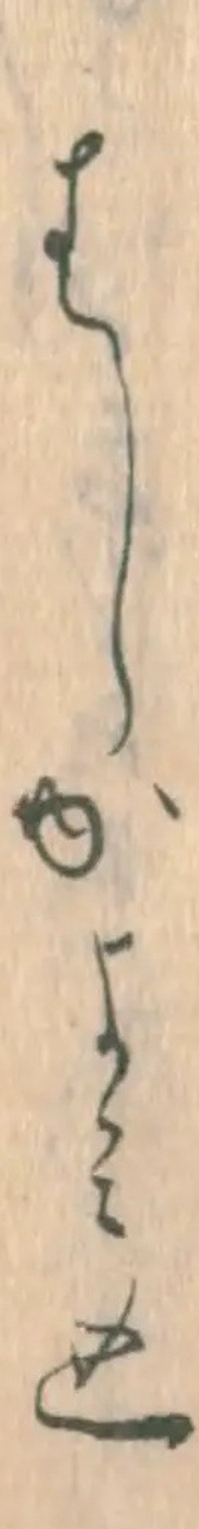はしかよみ込
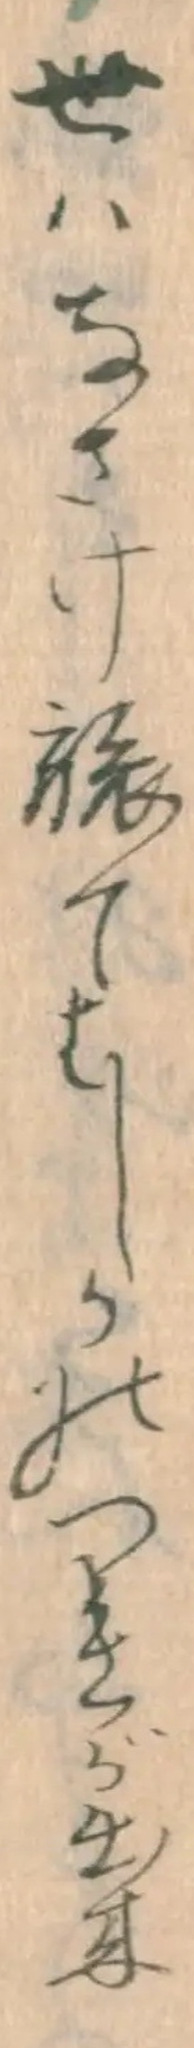世はなさけ旅ではしかのつれが出来
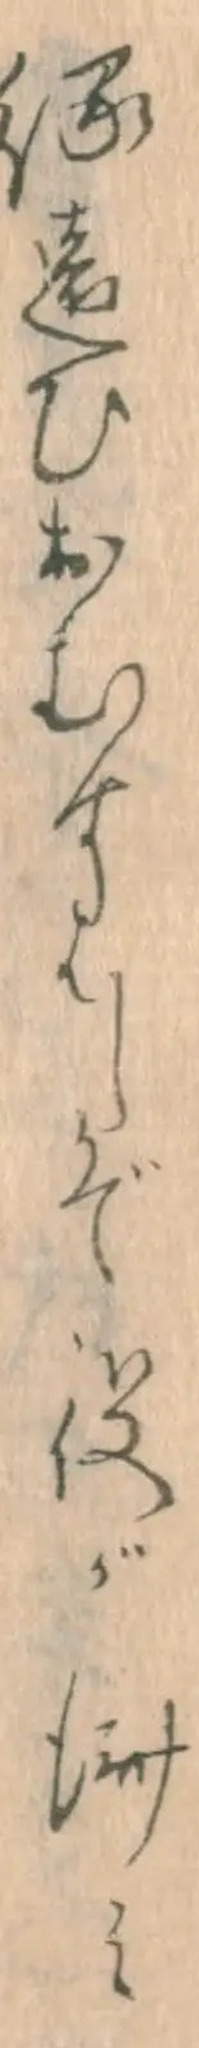縁遠ひおむすはしかで役が済み
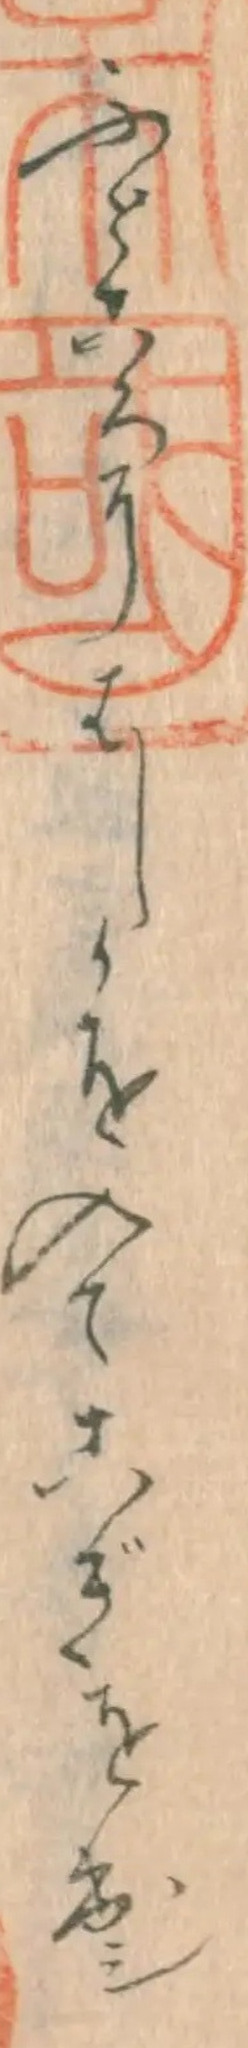ふところにはしかを入てこぎを出し
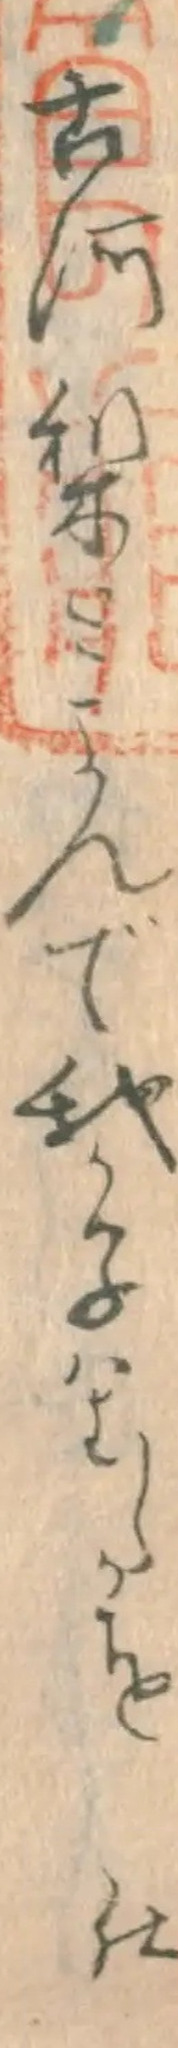古河梨とよんで我が子ははしかを仕
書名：麻疹後柳樽
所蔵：国立国会図書館 National Diet Library, JAPAN
